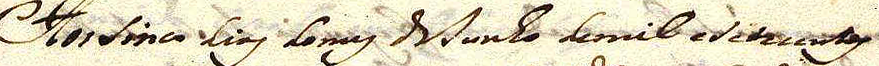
Aos sinco dias do mes de Iunho de mil e setecentos
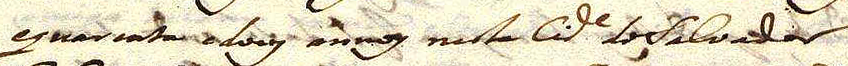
e quarenta e dous annos nesta Cid.e do Salvador
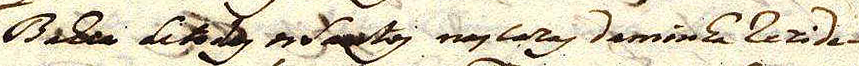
Bahia de todos os Santos nas cazas da minha Rezide
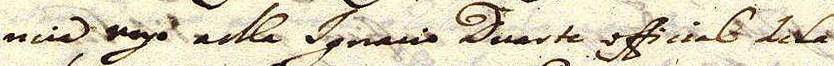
ncia, veyo a ella Ignacio Duarte official de la
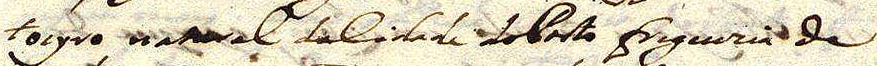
toeyro, natural da Cidade do Porto, freguezia de
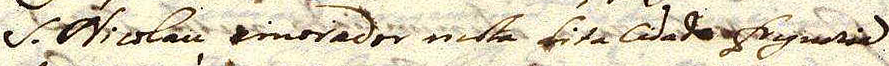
S. Nicolau, e morador nesta dita cidade freguesia
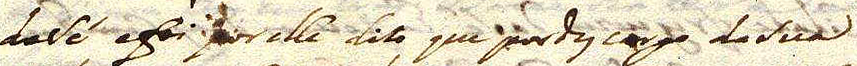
da Sé, e foi por elle dito, que por descargo da sua
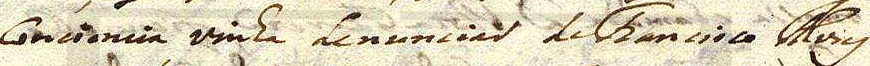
conciencia, vinha denunciar de Francisco Alvres
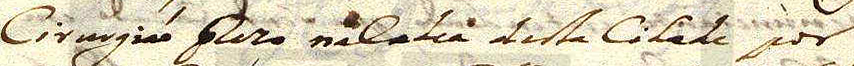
Cirurgiaõ prezo na Cadea desta Cidade por
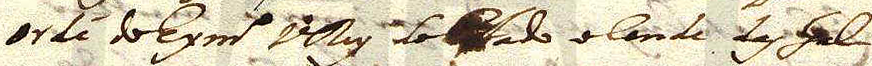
ordē do Exmo VRey do _tado o Conde das Gal
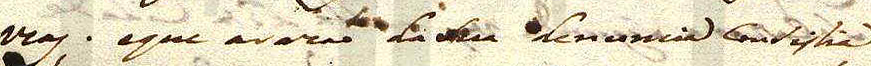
veas ; e que a razao da sua denuncia consistia,
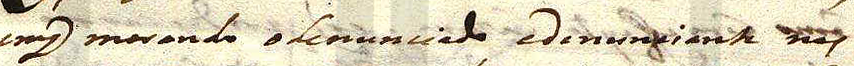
em q̄ morando o denunciado, e denunciante nas
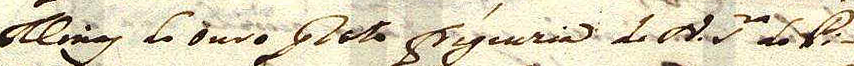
Minas de ouro preto freguezia de N. sra do Pi
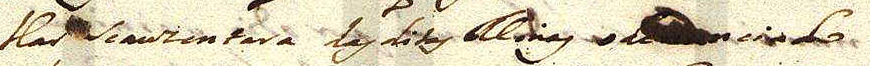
llar, se auzentara das ditas Minas o de__nciado
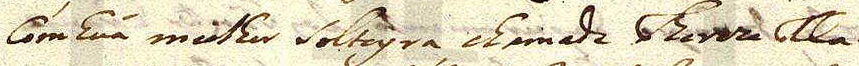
Com huā mulher solteyra, chamada Thereza Ma
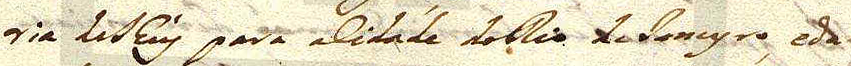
ria de Ihūs para a Cidade do Rio de Ianeyro, e da
